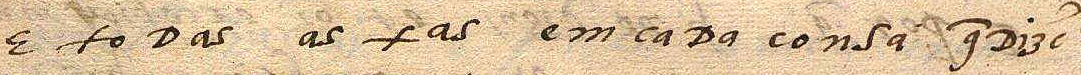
E toDas as tas em caDa cousa q̄ Dizē
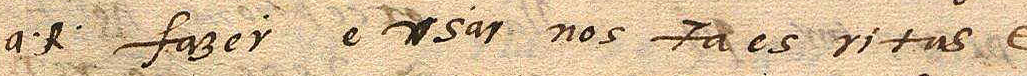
a .R. fazer e vsar nos taes tirus e
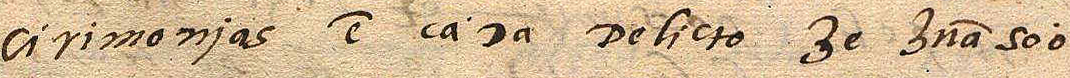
cirimonjas ē caDa Delicto he huā soo
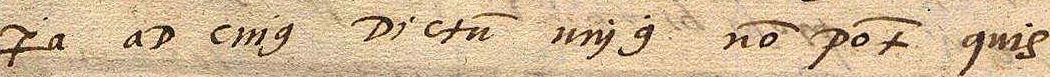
ta aD cuiꝯ Dictū unjꝯ n̄o pōt quis
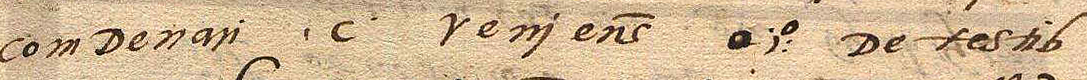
comDenari .c. venjen̄s o io De testib
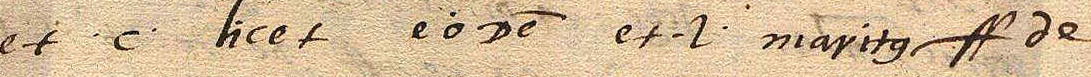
et .c. licet eoDē et .l. maritꝯ ff de
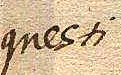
questi
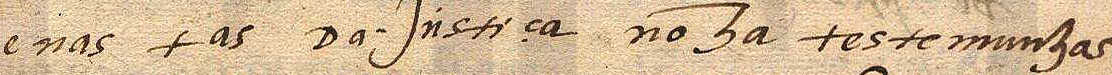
e nas tas Da Justica nō ha testemunhas
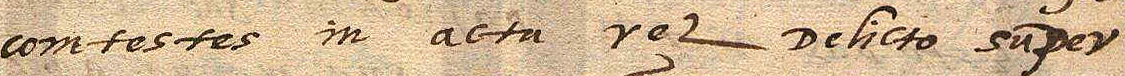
comtestes in acta reL Delicto sūper
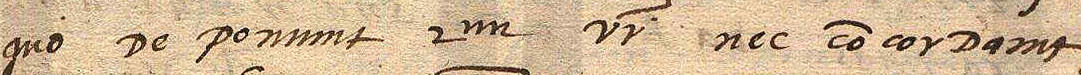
quo Deponumt 2nu vr̄ nec cō corDamt
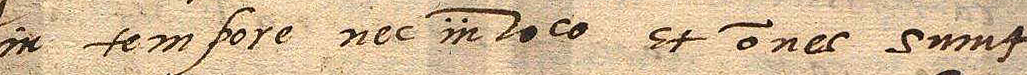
in tempore nec in loco Et ōnes sumt
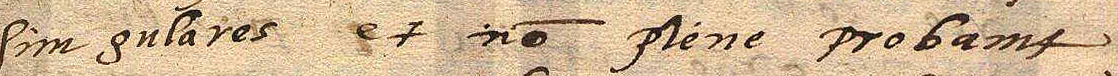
simgulares et nō plene probamt
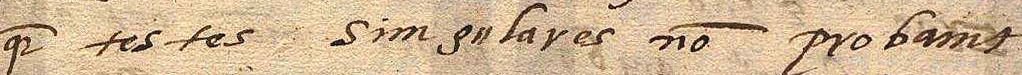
q̄r testes simgulares nō probamt
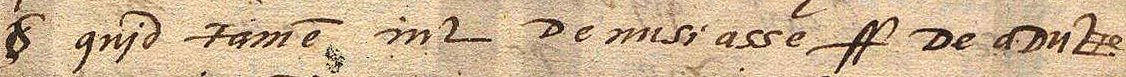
§ qujd tamē in L Demisi asse ff De aDuLte
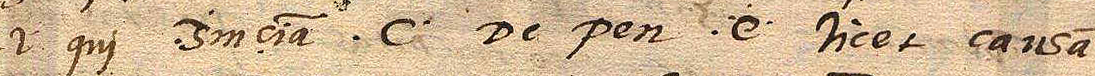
.L. quj smcīa .C. De pen .C. licet causā
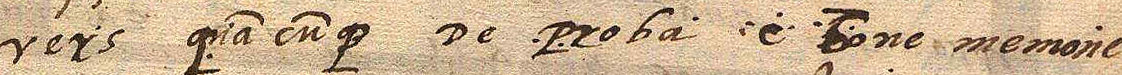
veris quā cūqꝫ De proba .c. bone memone
